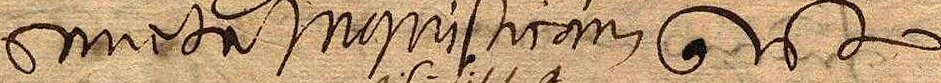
sancta Jnquisiçam q̄ esto
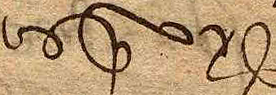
esp̄vy
